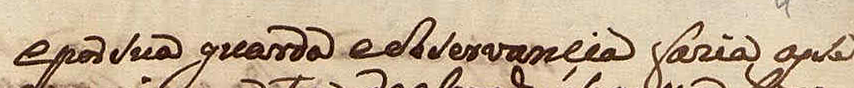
e por sua guarda e observancia fazia as se
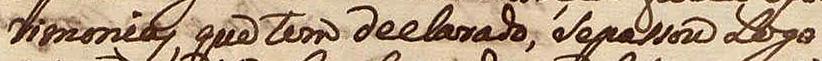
rimonias que tem declarado, se passou Logo
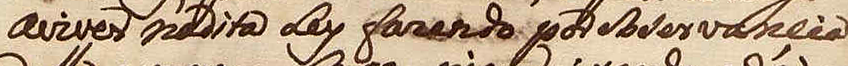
a viver na dita Ley fazendo por observancia
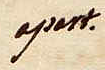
apart.
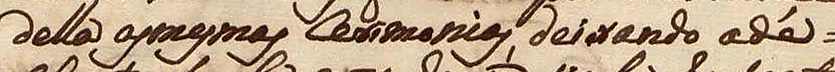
della as mesmas Cerimonias, deixando a de
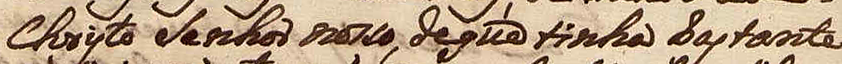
Christo Senhor nosso, de que tinha bastante
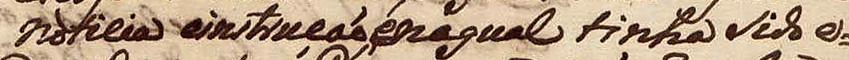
noticia e instruçaõ, e na qual tinha sido e
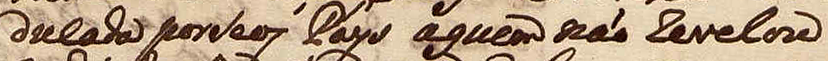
ducada por seos Pays a quem naõ Revelou
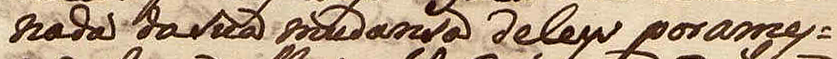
nada da sua mudansa de leys por a mes
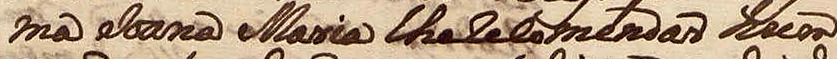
ma Ioana Maria lhe Recomendar hum
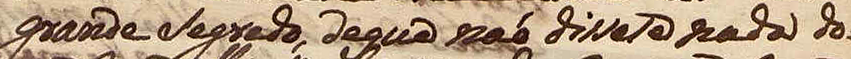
grande segredo, de que naõ dissese nada do
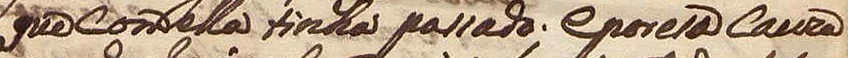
que com ella tinha passado; e por esa cauza
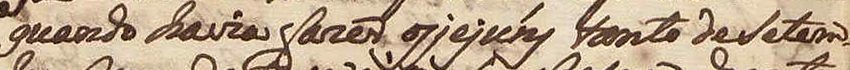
quando havia fazer os jejuns tanto de setem
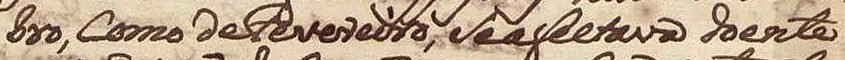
bro, Como de Fevereiro, se afectava doente
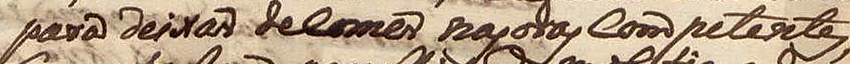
para deixar de comer nas oras competentes
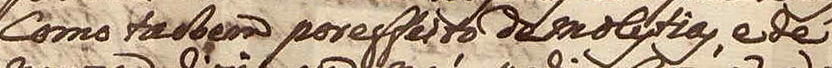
como taobem por effeito de molestias, e de
